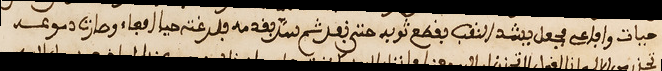حيات وافاعى فجعل يشد النقب بقطع ثوبه حتى بقر ثم سر بقدمه فلدغته حيا افعاء وصارت دموعه
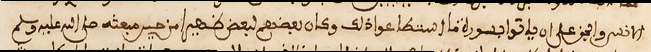الانسر والجن على ان يا تواجسورة ما استطاعوا ذلك وكان بعضهم لبعض ظهير امن حين مبعثه صلى الله عليه وسلم
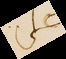على
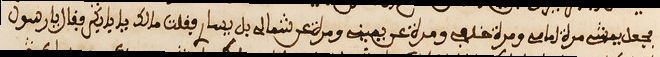فجعل يمشى مرة امامى ومرة خلفى ومرة عن يمينى ومرة عن شمالى بل يساري فقلت مالك يا با بكر فقال يا رسول
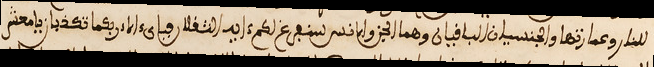للنار وعمارتها والجنسيان الباقبان وهما الجن والانس سنفرغ لكم ءايه الثقلان فباىء الاءربكما تكذبان يا معشر
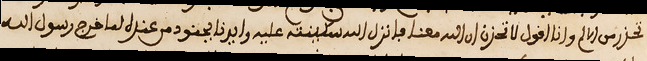تحزر من الالم وانا اقول لا تحزن ان الله معنا فانزل الله سكينته عليه وايدنا بجنود من عنده لما خرج رسول الله
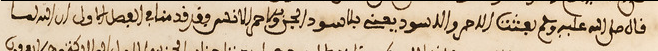قال صلى الله عليه وسلم بعثت الاحمر والاسود بفنى بلاسود الجن ولا حمر الانس فقد قد منا في الفصل الاول ان الله لما
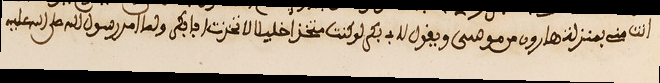انت منى بمنزلة هارون من موسى ويقول لابى بكر لو كنت متخذا خليلا لا تخذت ابا بكر ولما امر رسول الله صلى الله عليه
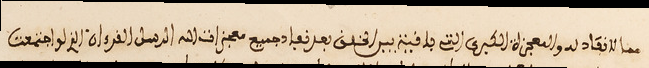مما لا نفاد له والبعخرة الكبرى التى باقية بين الخلق بعد نفاد جميع معجزات الله الرسل القرءان الذي لو اجتمعت
